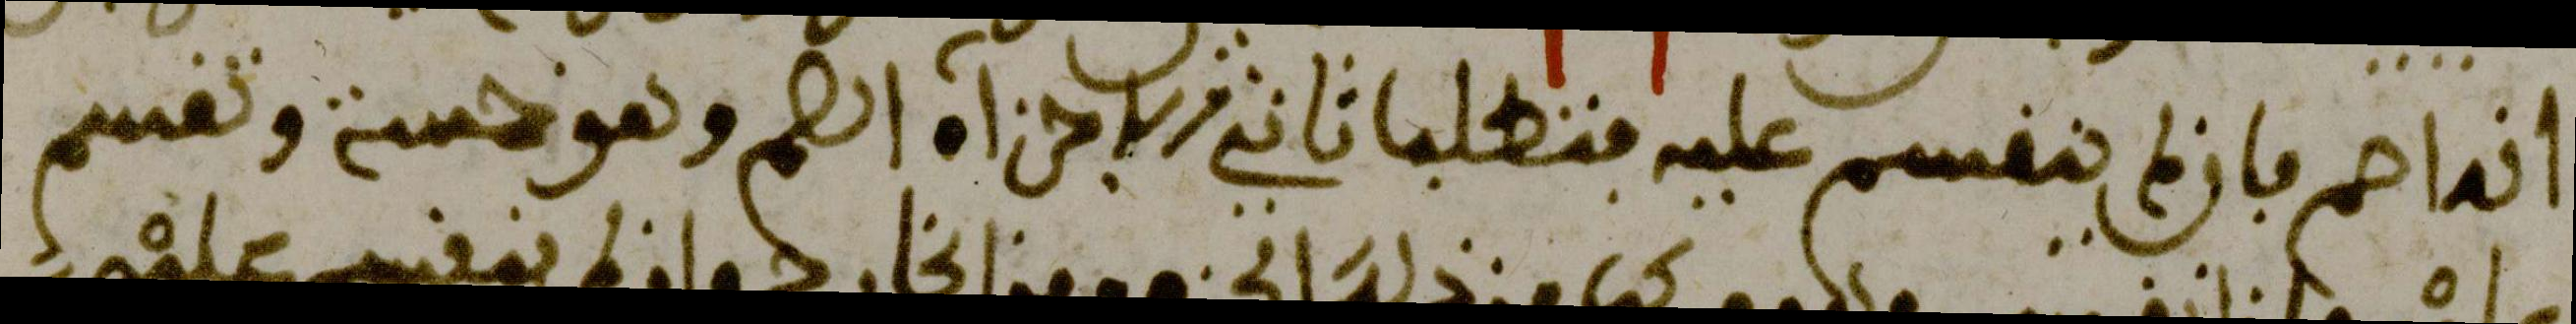انه اصم فان لم ينقسم فهو مركب من ذلك الجزء ومن الخارج وان لم ينقسم عليه
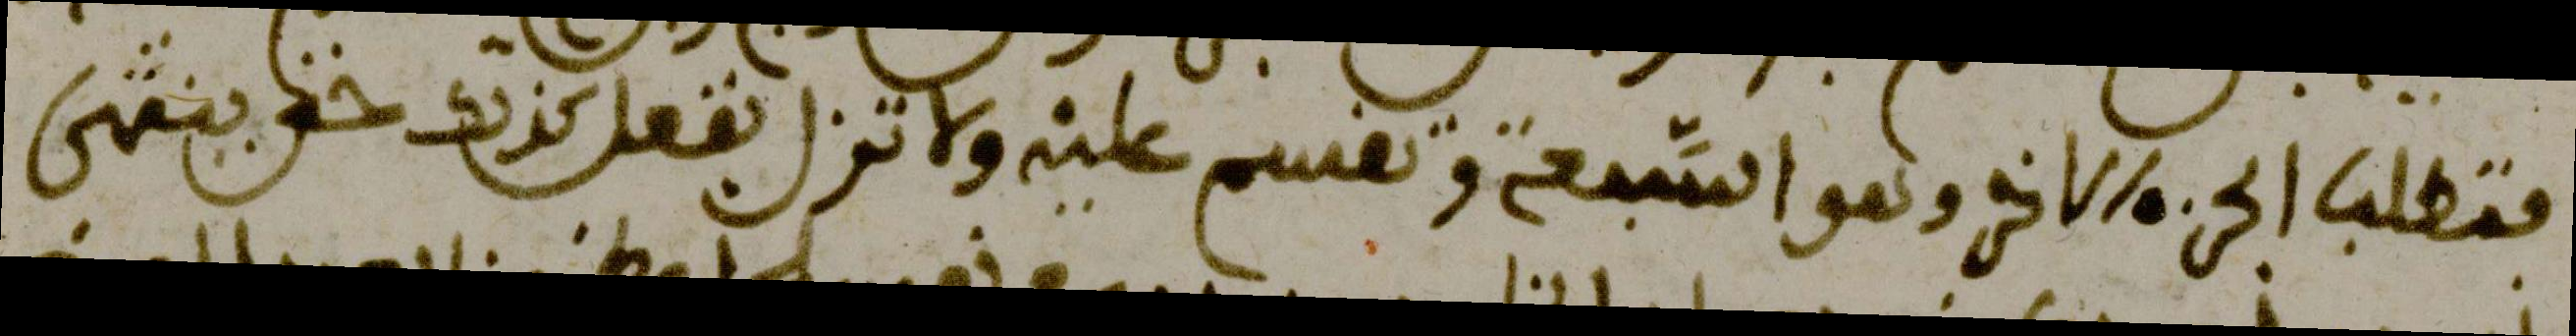فتطلب الجزء الاخر وهو السبعة وتقسم عليه ولا تزل تفعل كذلك حتى ينتهى
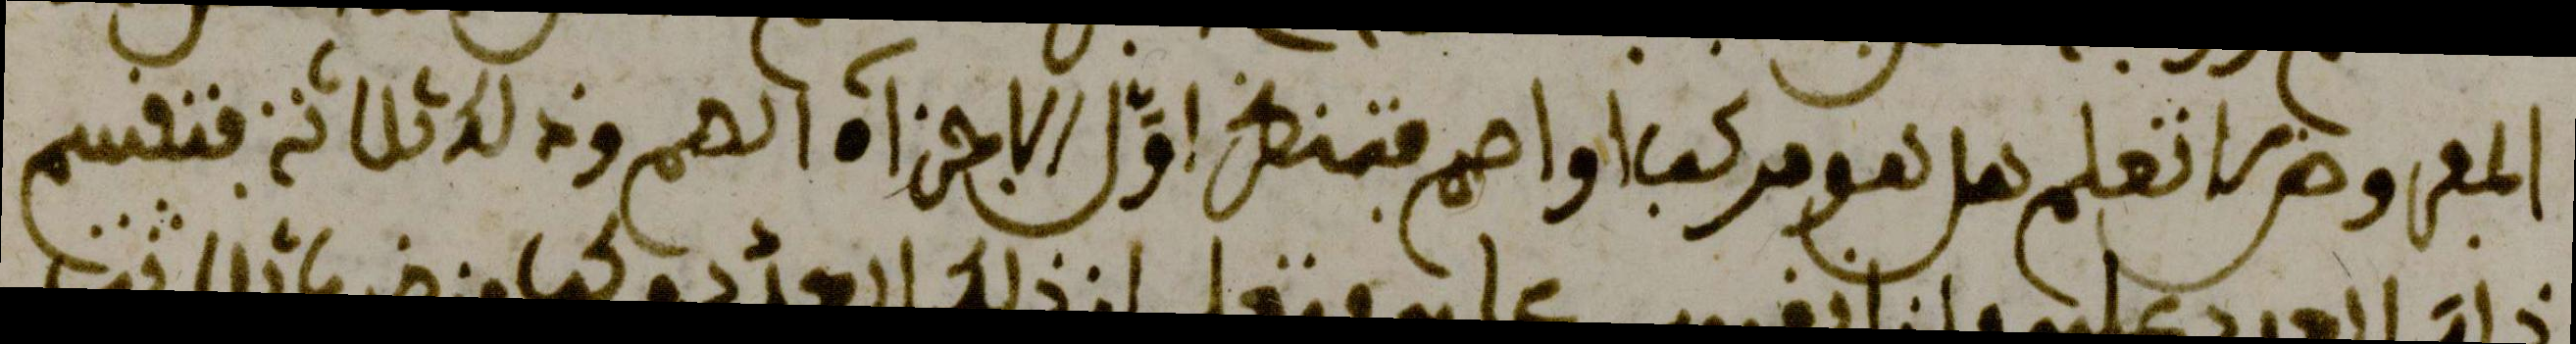المفروض لا تعلم هل هو مركب او اصم فتنظر اوّل الاجزاء الصم وذلك ثلاثة فتقسم
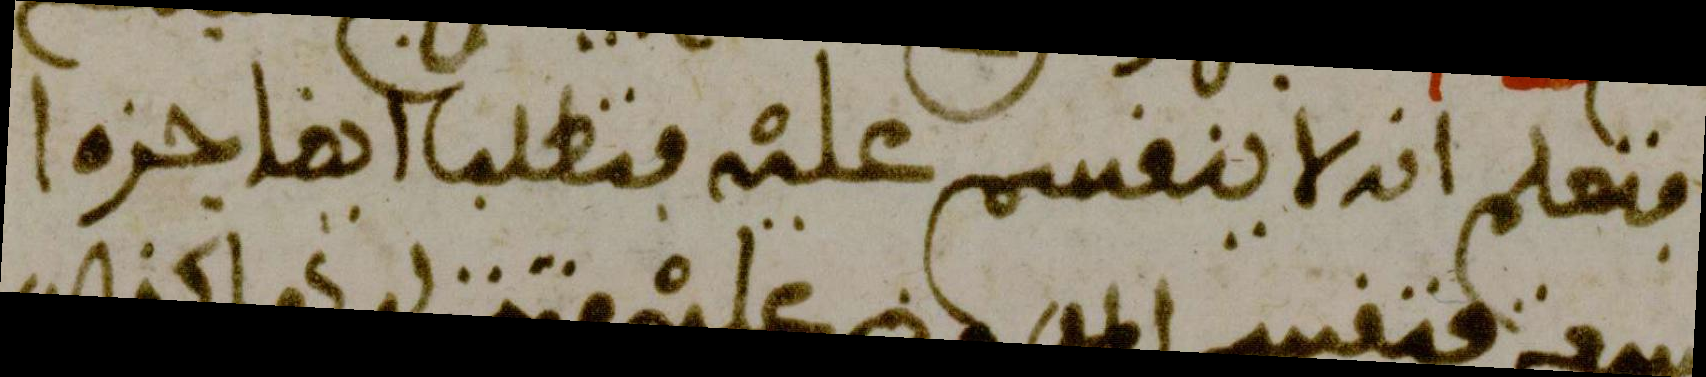فتعلم انه لا ينقسم عليه فتطلب ايضا جزءا
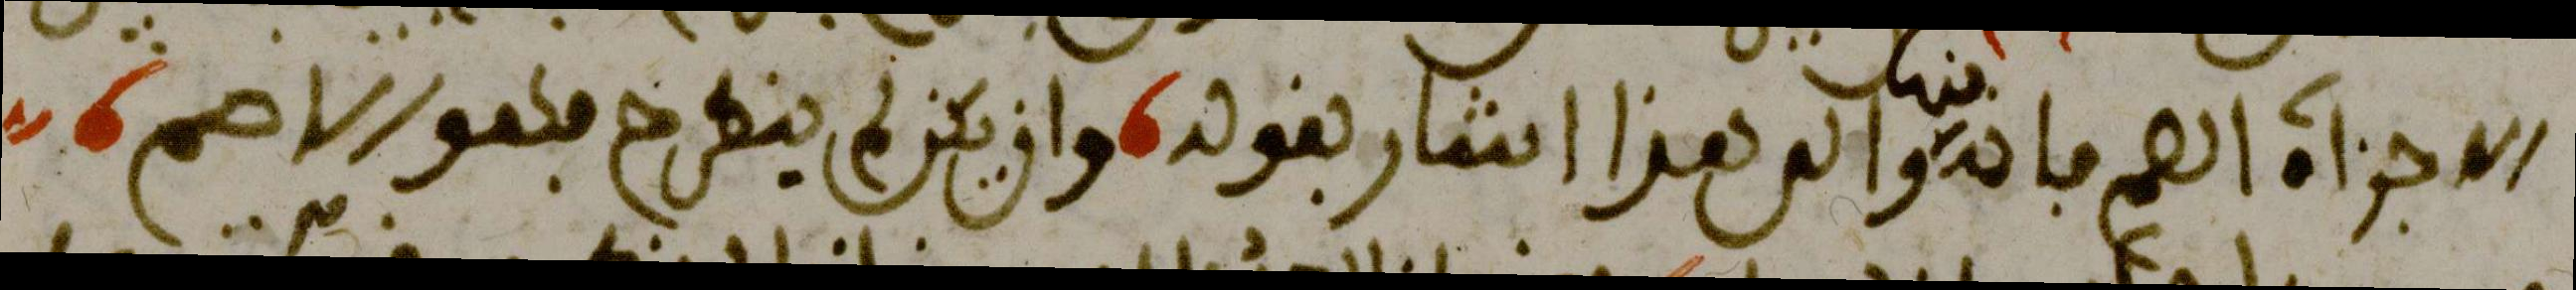الاجزاء الصم فانه والى هذا اشار بقوله وان يكن لم ينطرح فهو الاصم
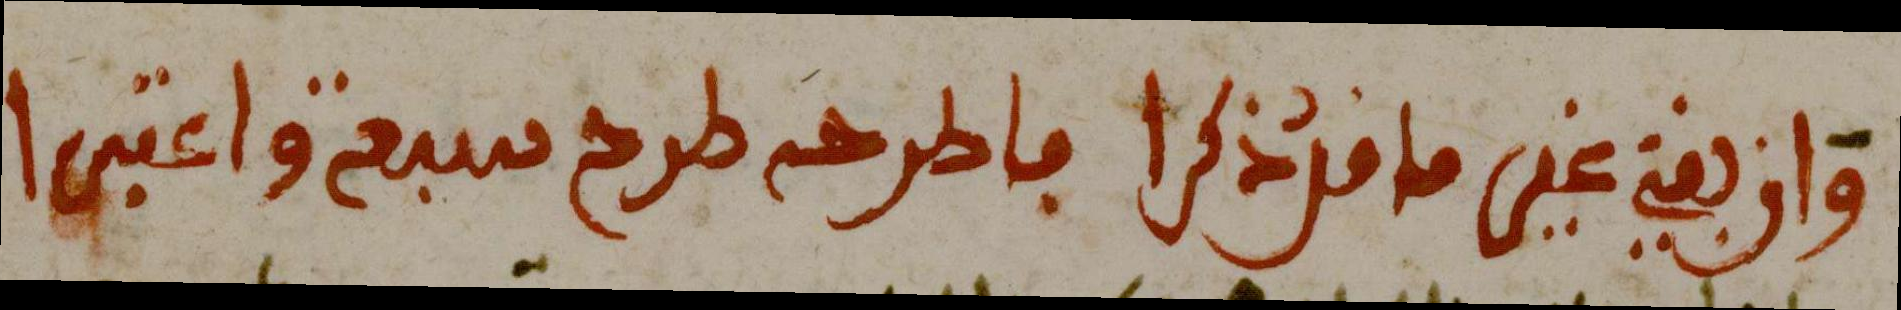وان بقني غير ما قد ذكرا فاطرحه طرح سبعة واعتبرا
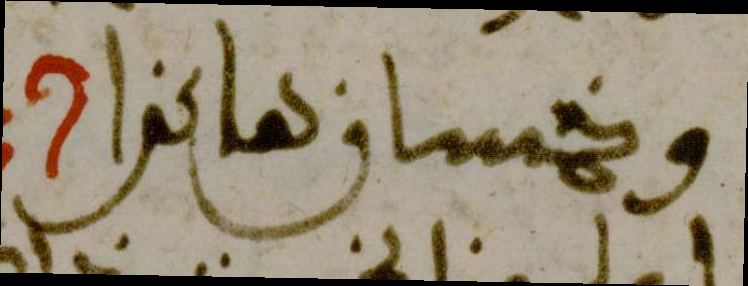وخمسان هاكذا 7
